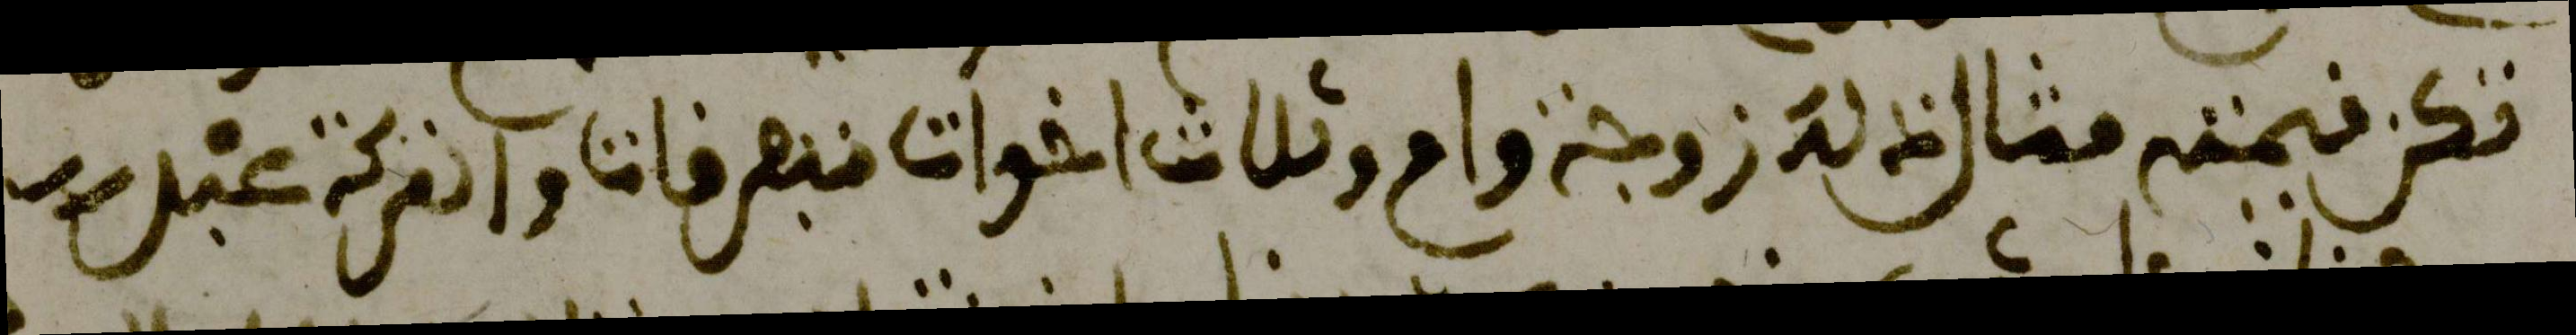تكن قيمته مثال ذلك زوجة وام وثلاث اخوات متفرقات والتركة عبْد
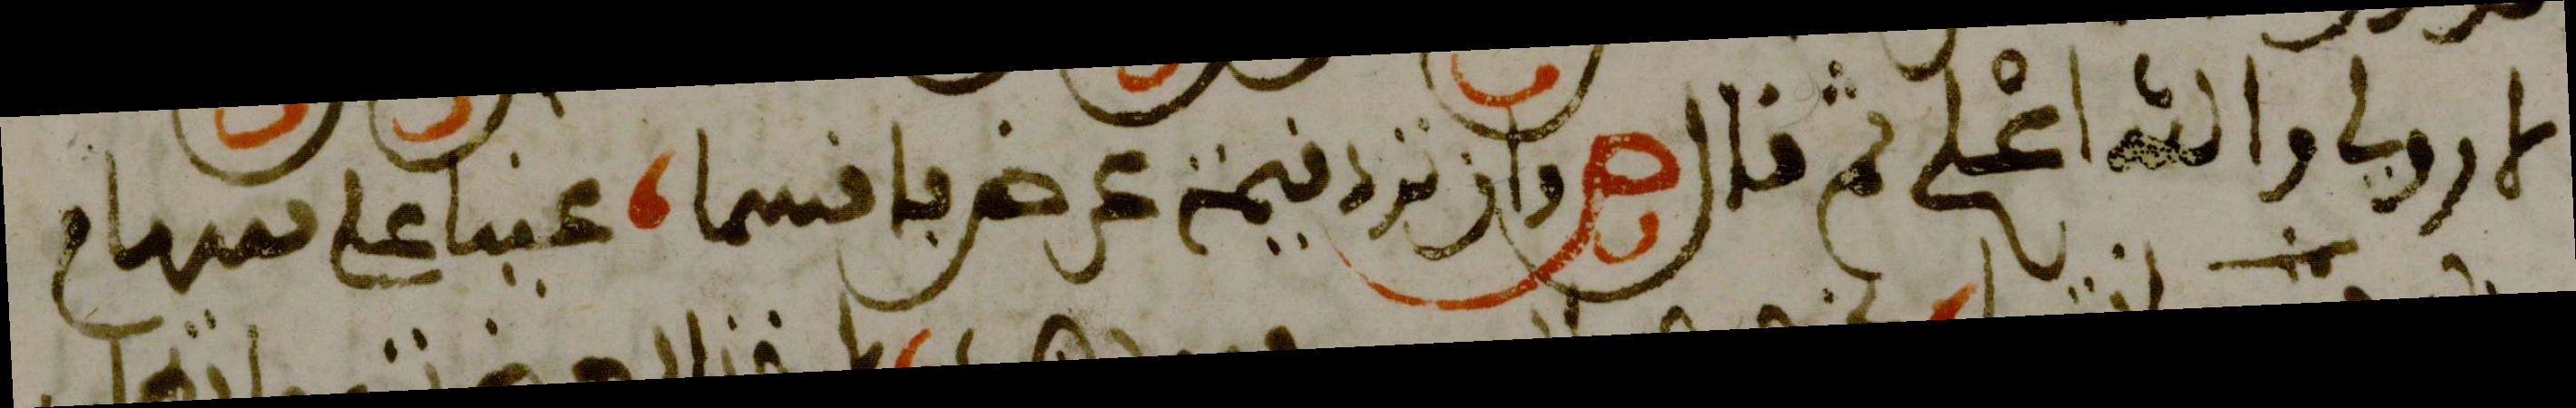لا روي والله اعْلم ثم قال ص وان ترد قيمة عرض فاقسما عينا على سهام
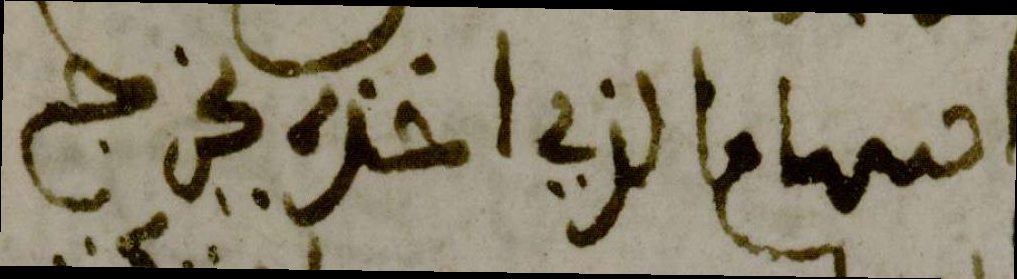سهام الذي اخذه يخرج
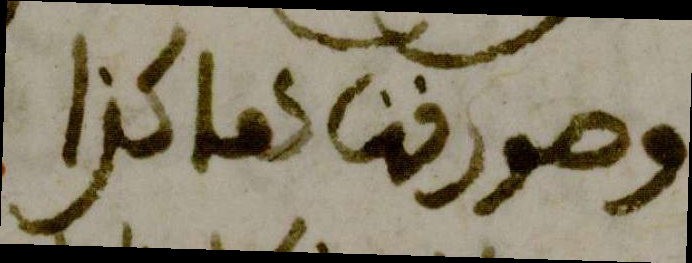وصرتها هاكذا
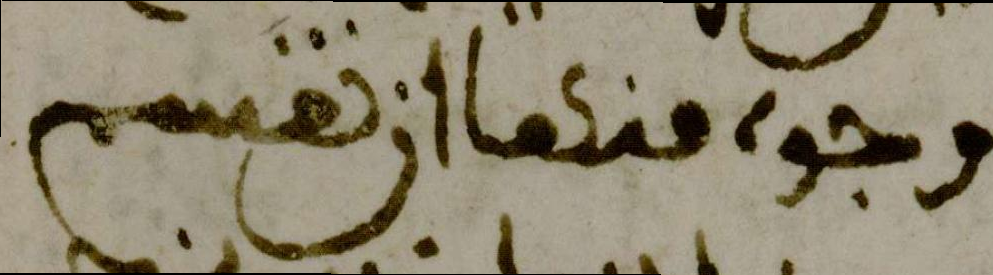وجوه منها ان تقسم
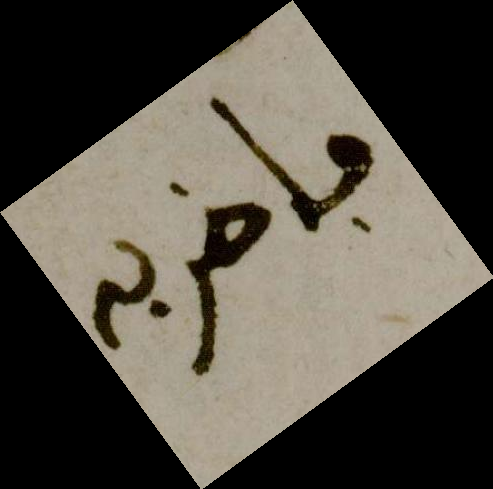فاضربه
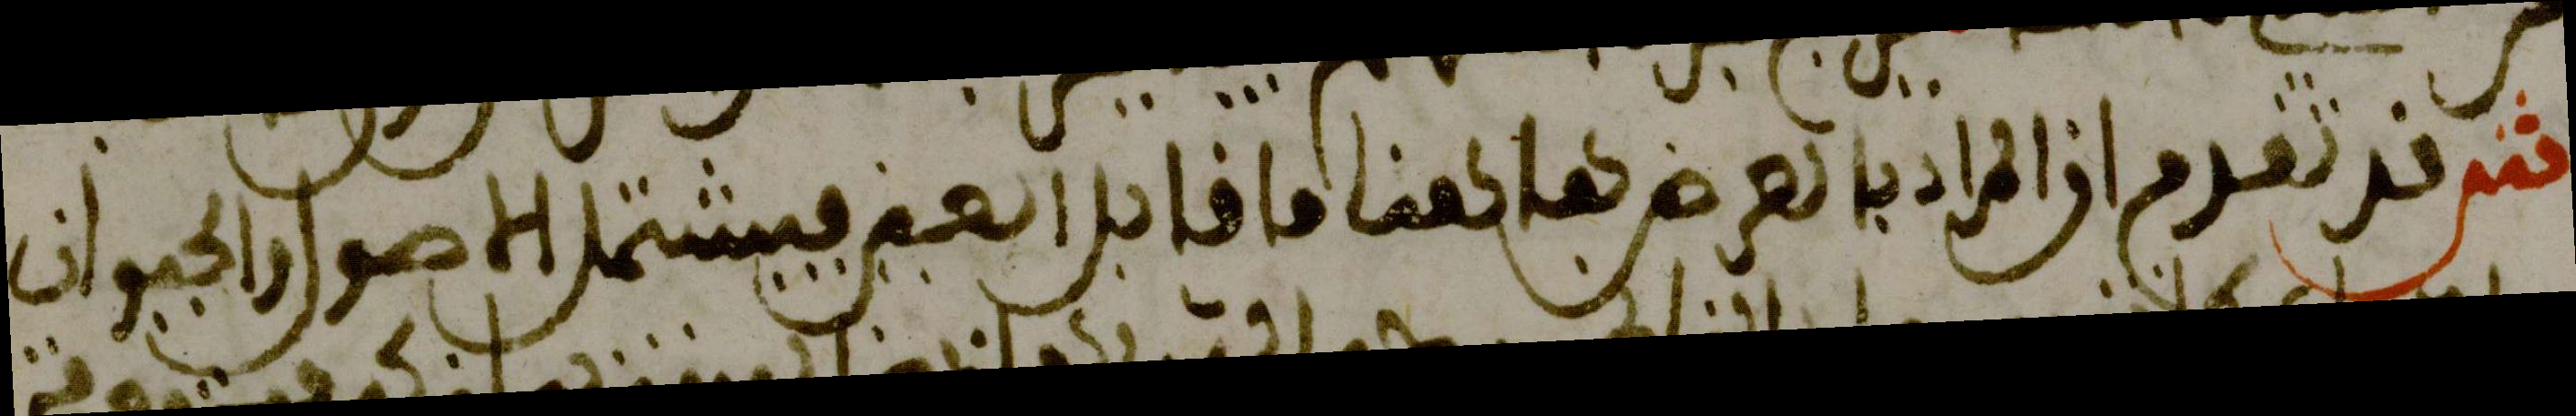ش قد تقدم ان المراد بالعرض هاهنا ما قابل العين فيشمل الاصول والحيوان
